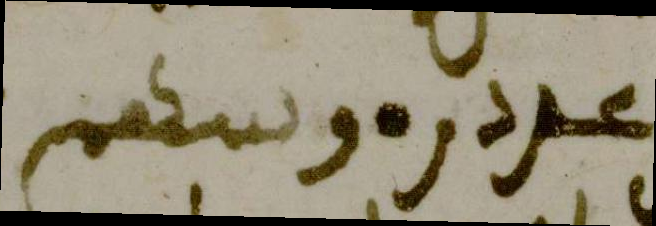عدد رءوسهم
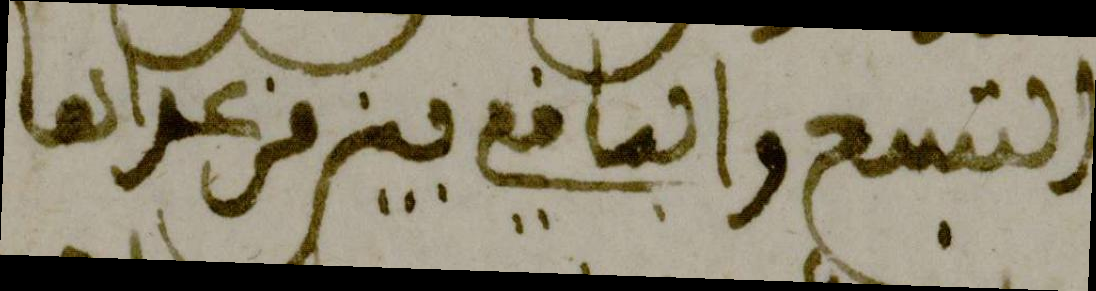التسع والباقي بين من عداها
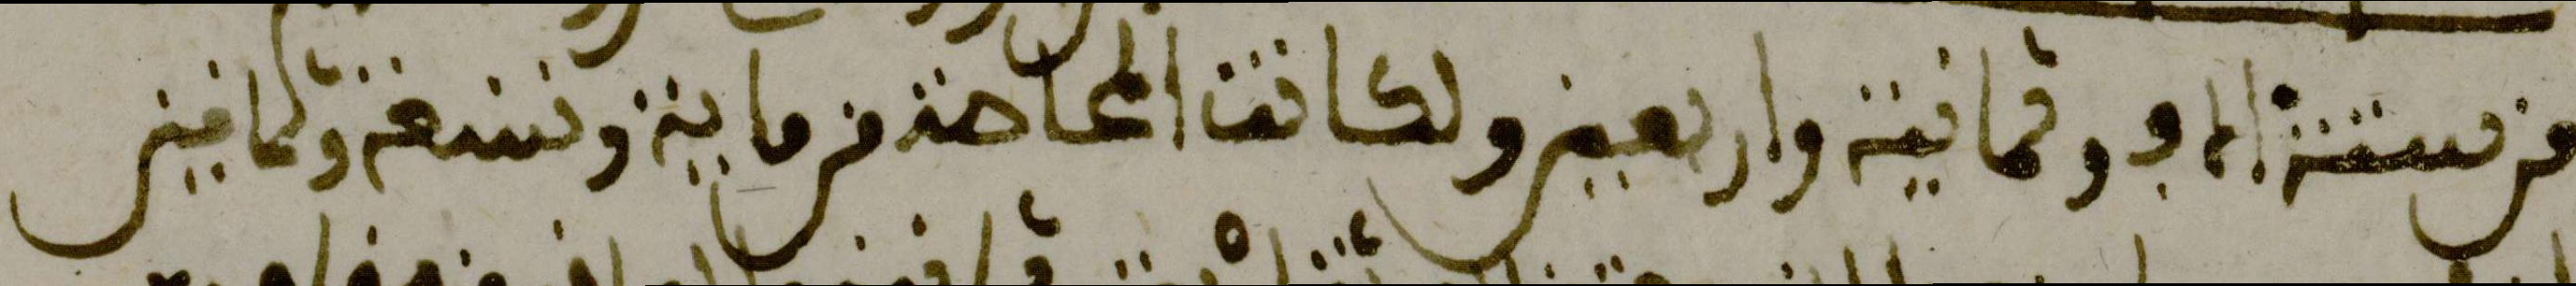من ستة ءالاف وثمانية واربعين ولكانت المحاصة من ماية وتسعة وثمانين
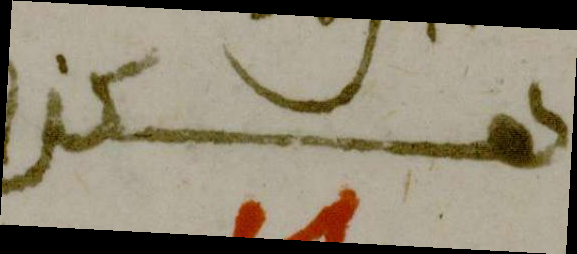هكذا
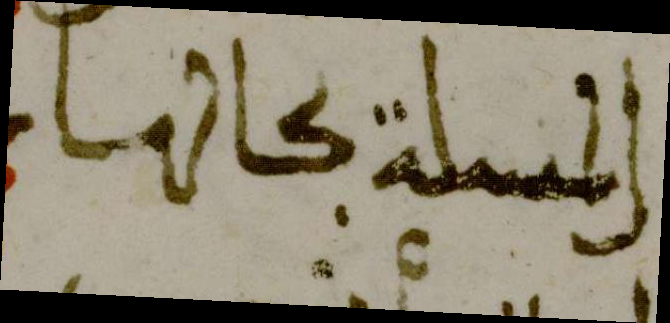المسلة بحالها
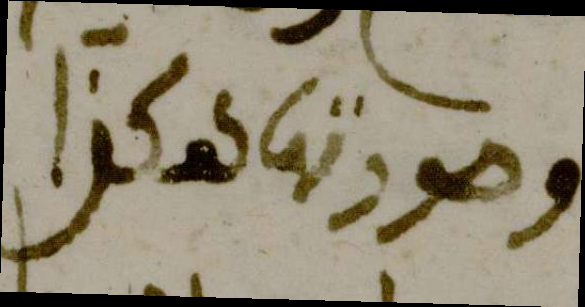وصورتها هكذا
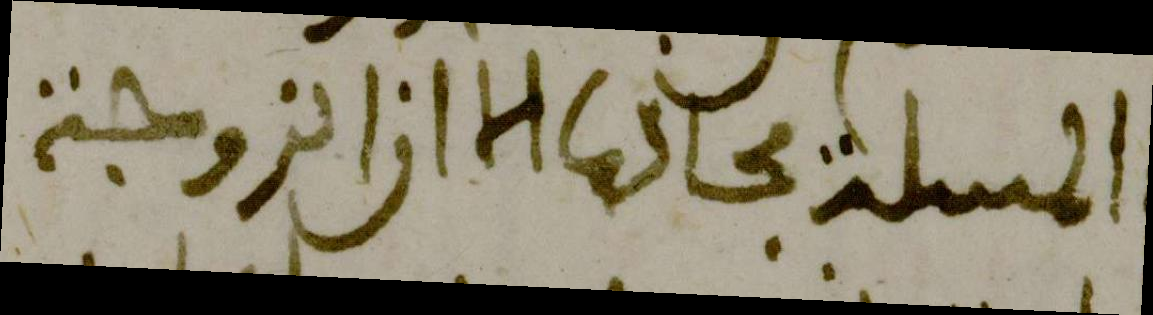المسلة بجالها الا ان الزوجة
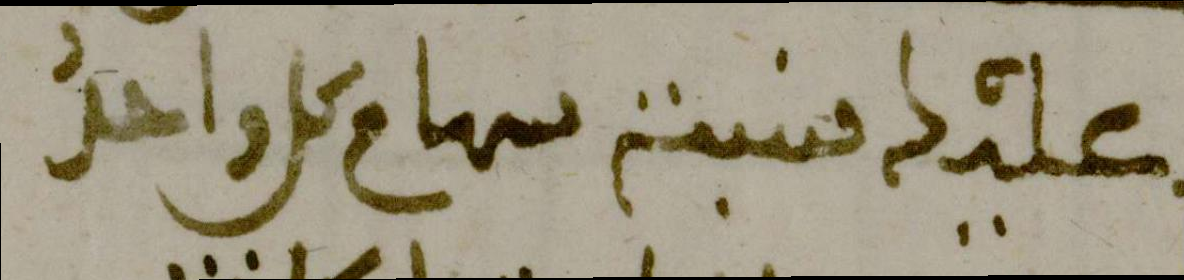عليْك نسبة سهام كل واحد
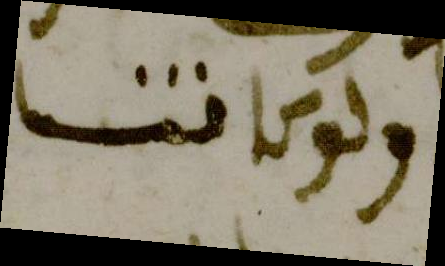ولو كانت
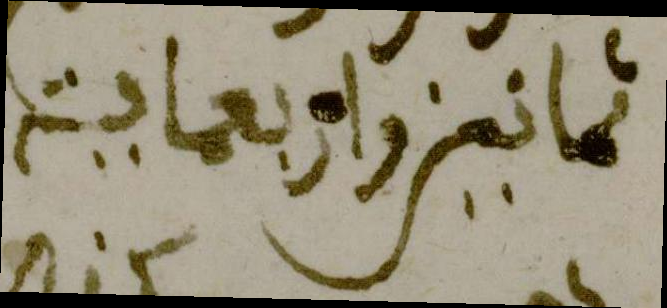ثمانين وارْبعماية
